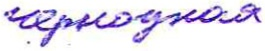черноухая
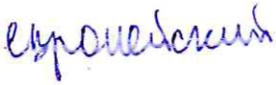европейский
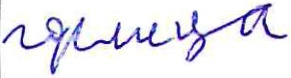горлица
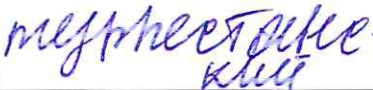турпестанский
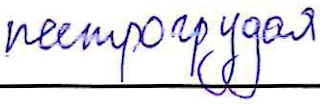пестрогрудая
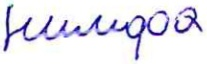нимфа
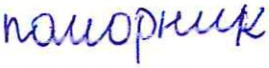поморник
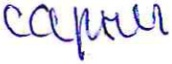сарыч
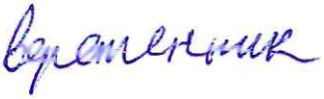веретенник
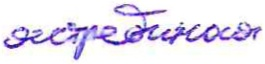ястребиная
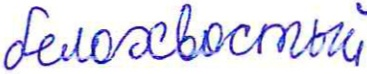белохвостый
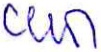сип
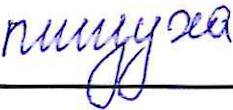пищуха
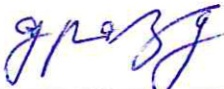дрозд
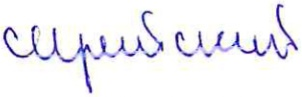сирийский
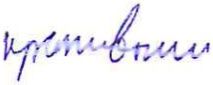крапивник
